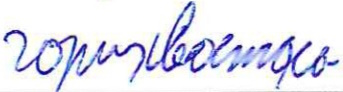горихвостди
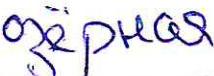озёрная
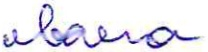иволга
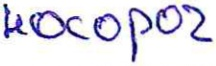носорог
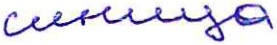синица
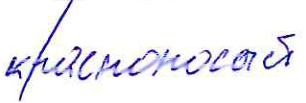красноносый
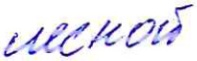лесной
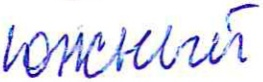южный
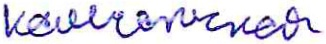комчатская
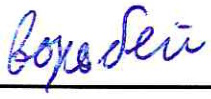воробей
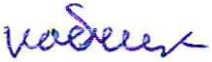кабчик
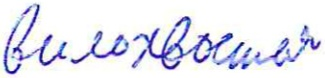вилохвостая
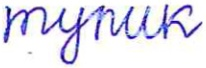тупик
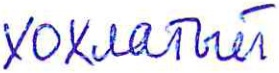хохлатый
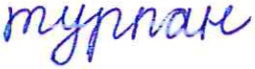турпан
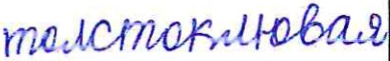толстоклювая
